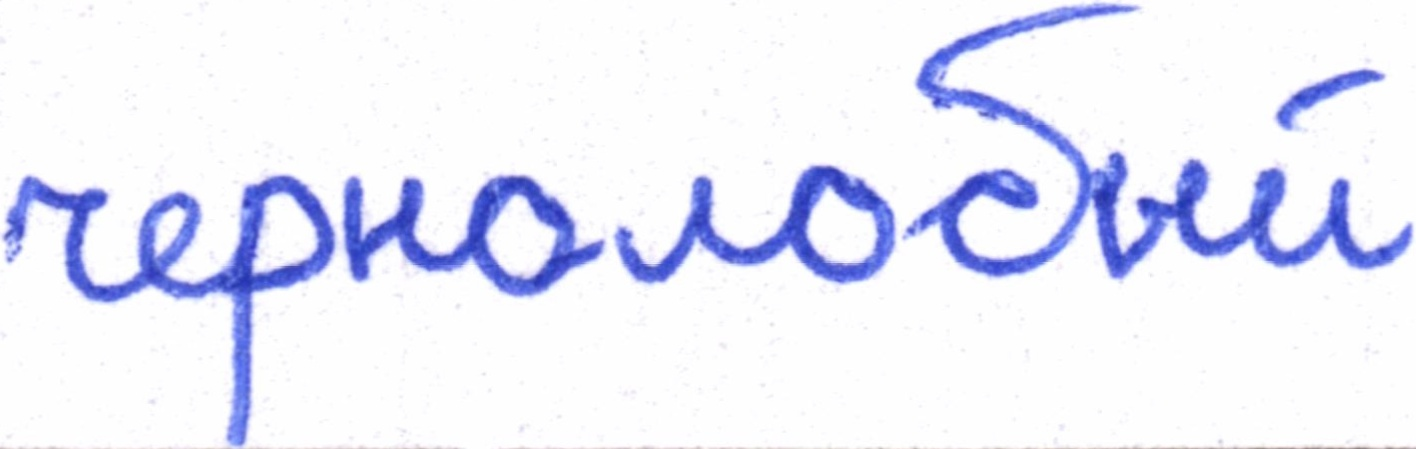чернолобый
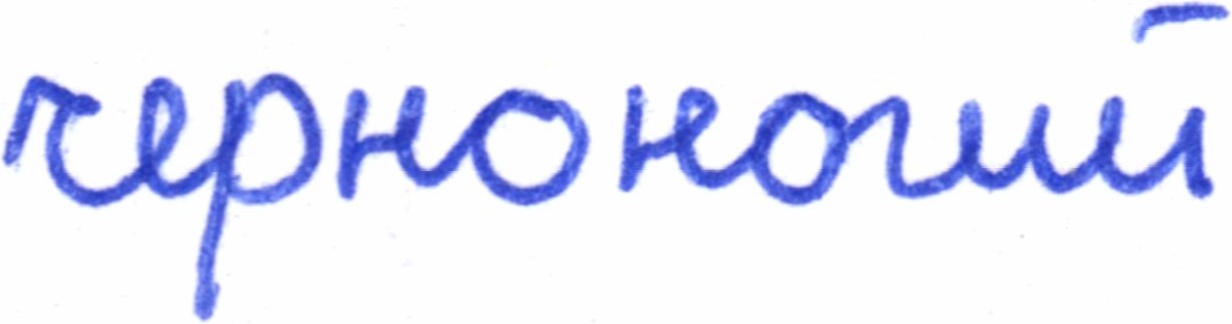черноногий
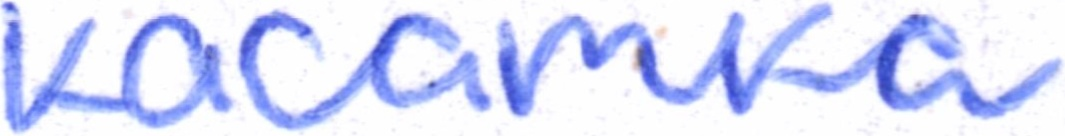касатка
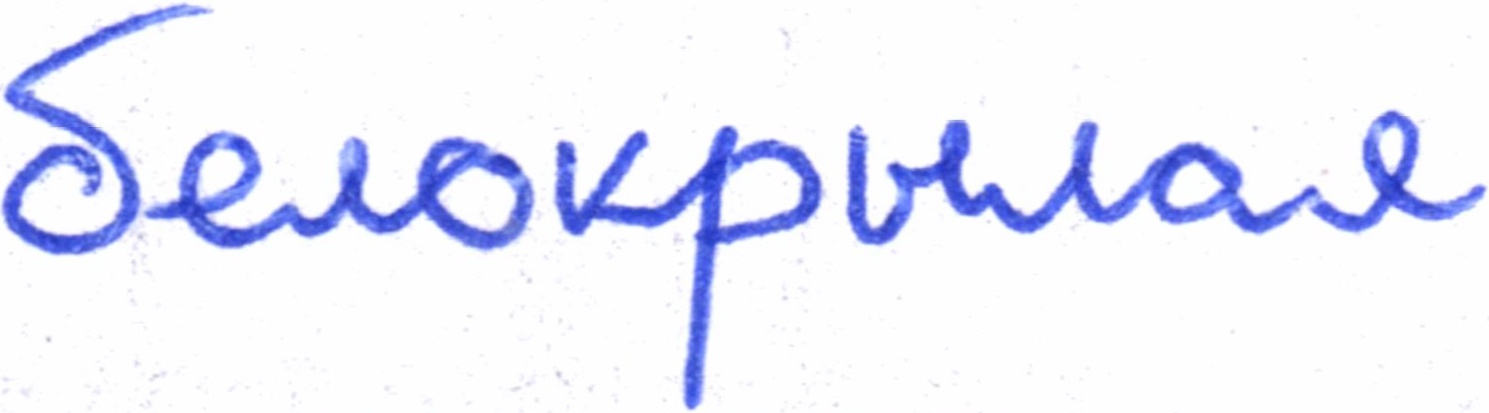белокрылая
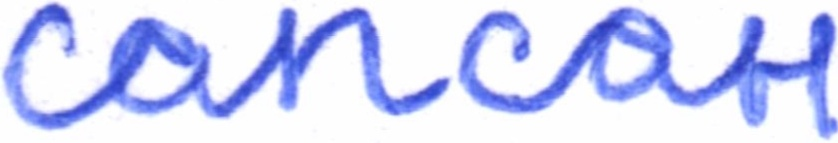сапсан
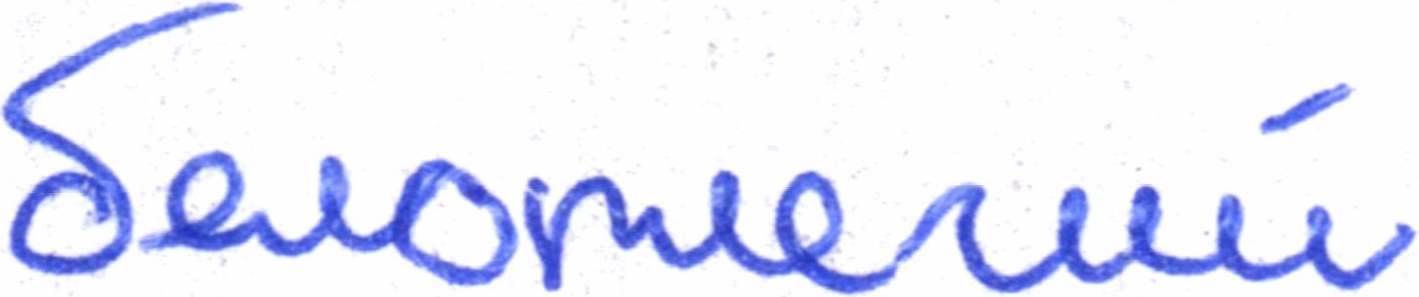белоплечий
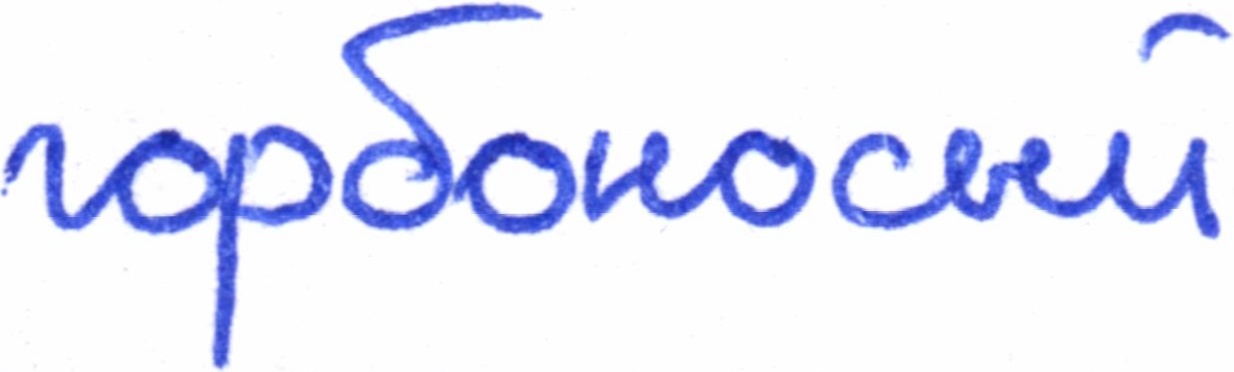горбоносый
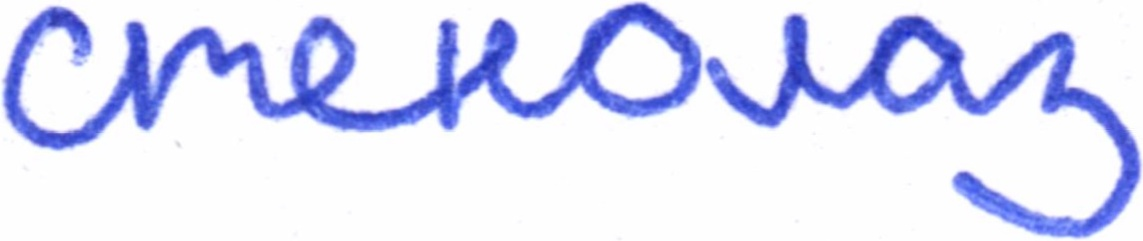стенолаз
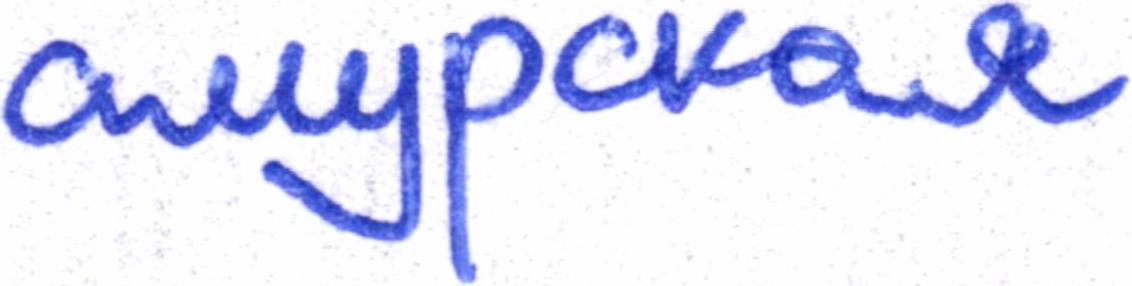амурская
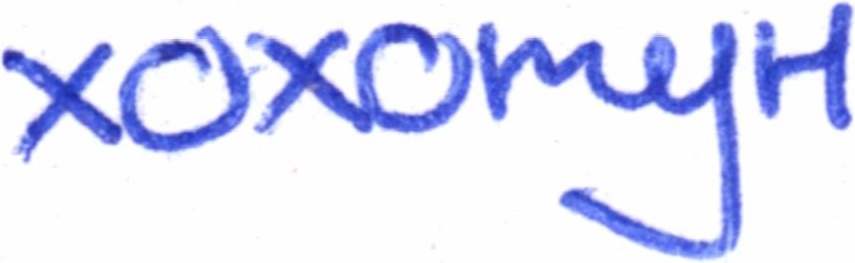хохотун
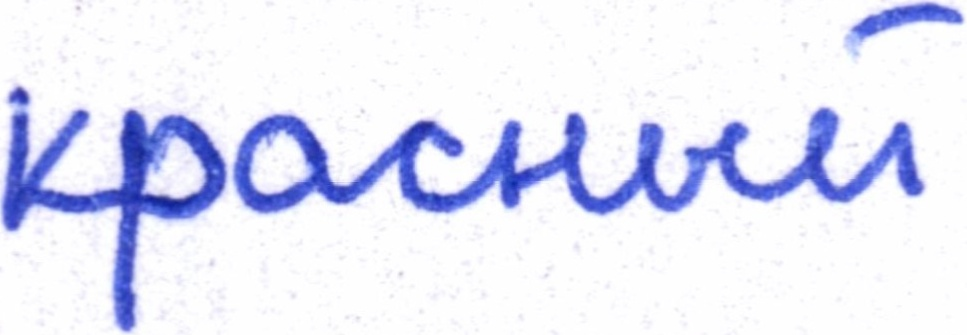красный
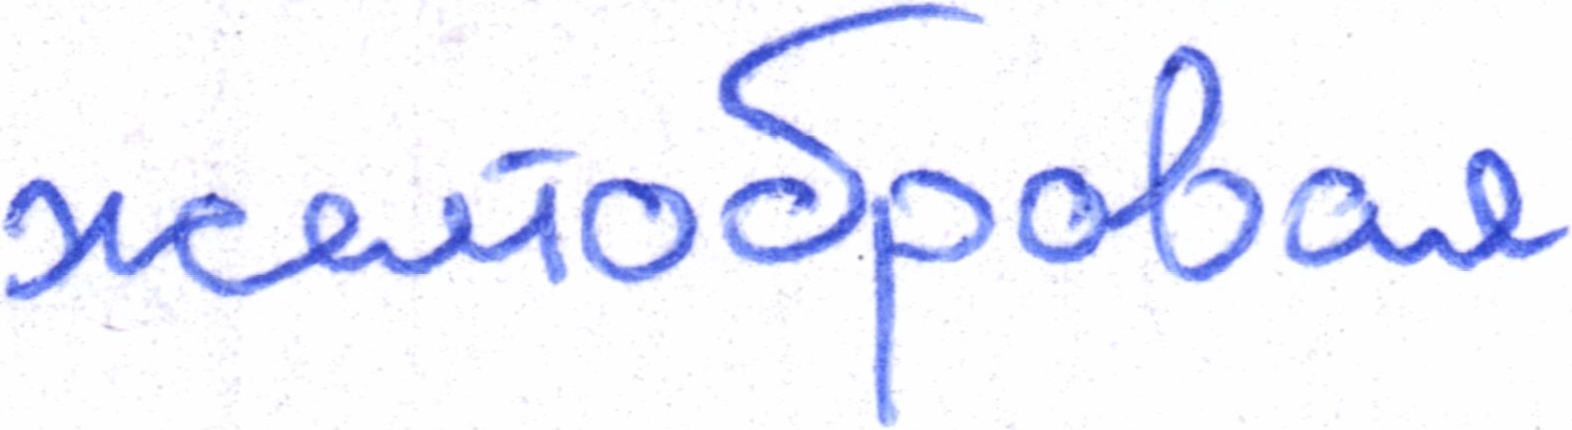желтобровая
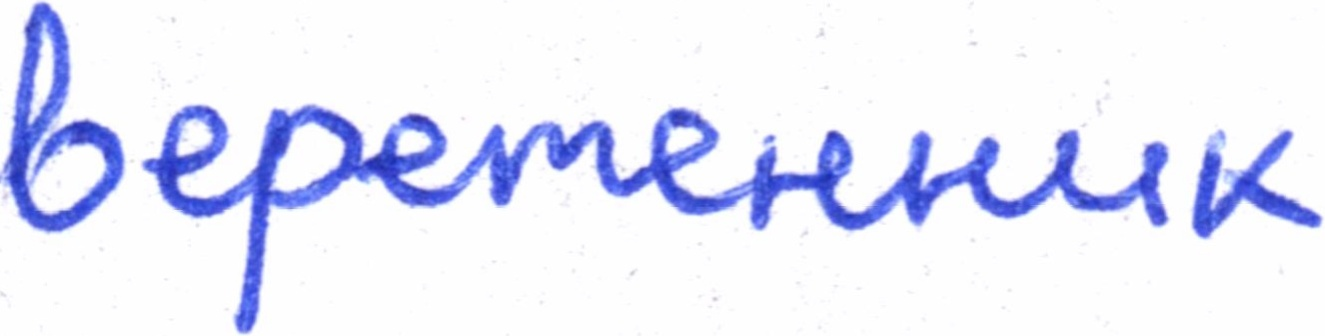веретенник
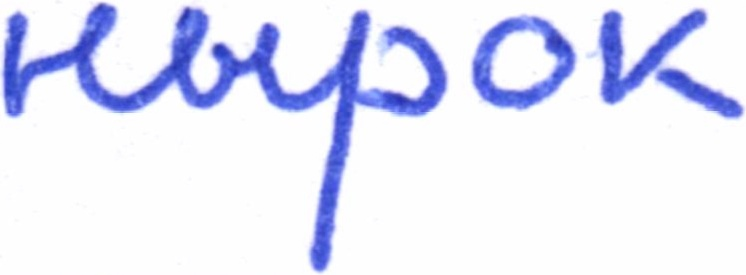нырок
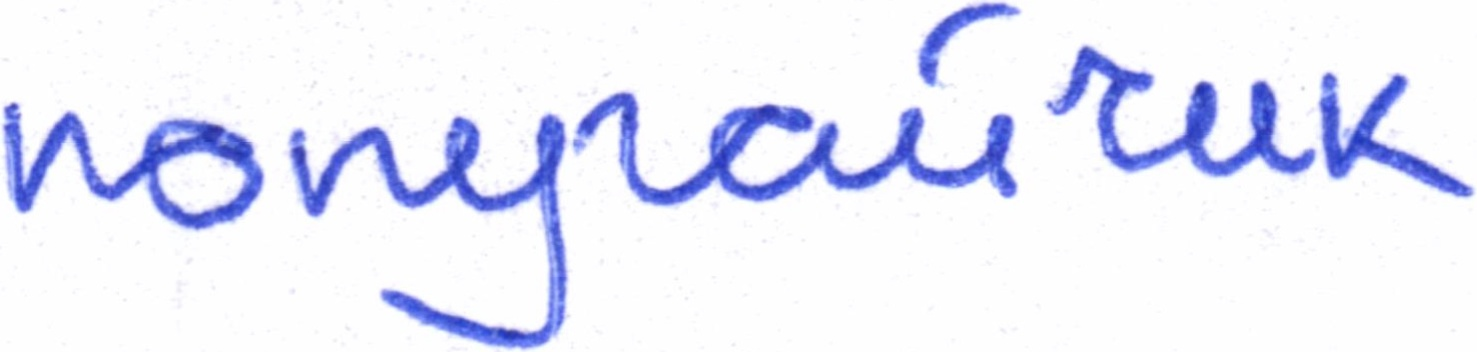попугайчик
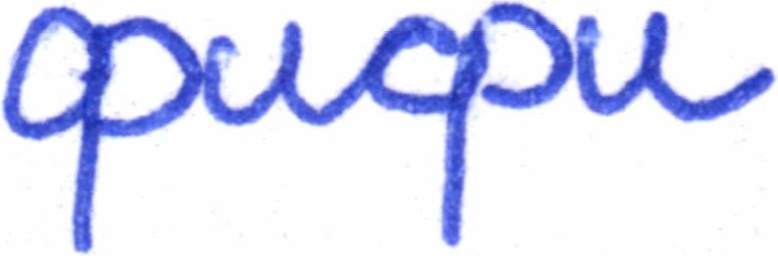фифи
